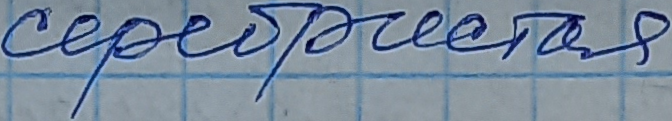серебристая
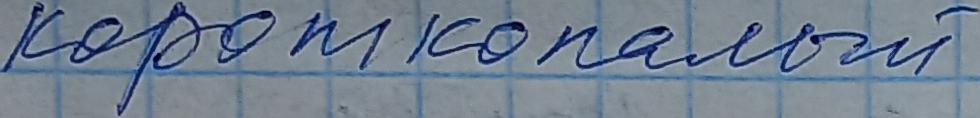короткопалый
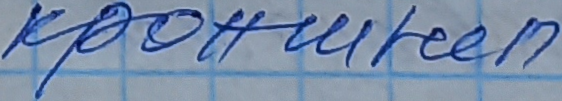кроншнеп
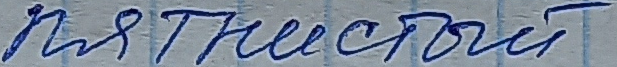пятнистый
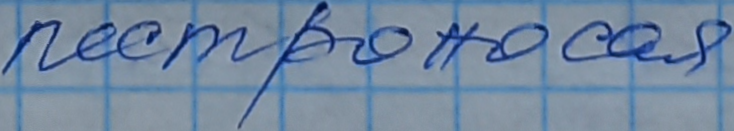пестроносая
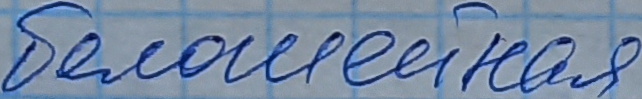белошейная
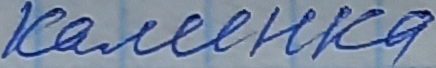каменка
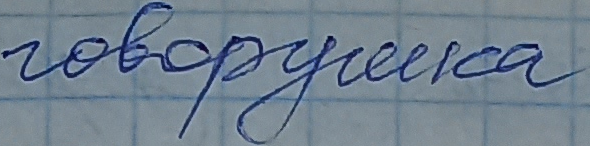говорушка
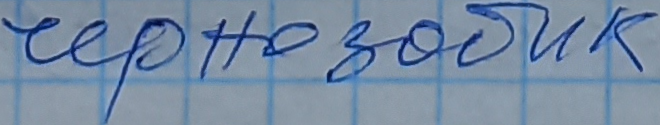чернозобик
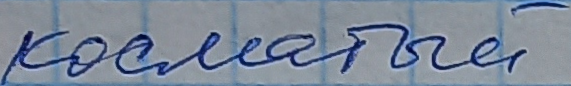косматый
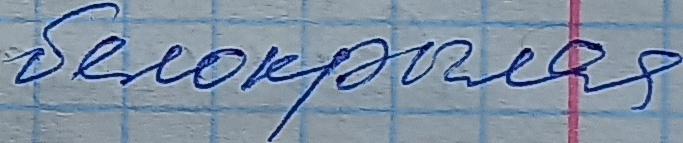белокрылая
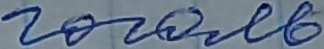гоголь
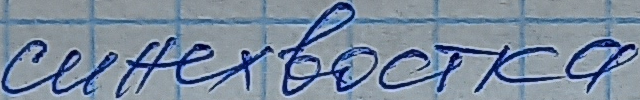синехвостка
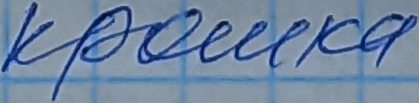крошка
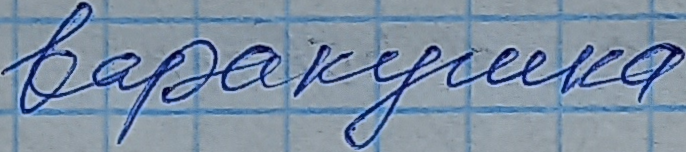варакушка
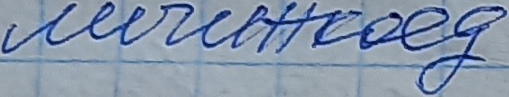личинкоед
